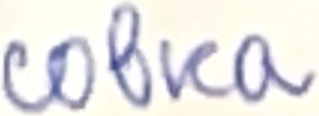совка
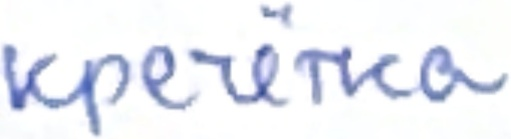кречётка
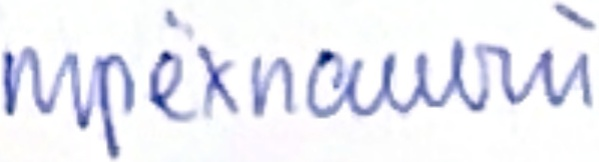трёхпалый
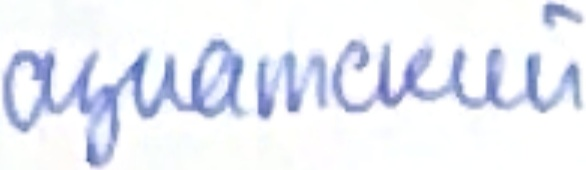азиатский
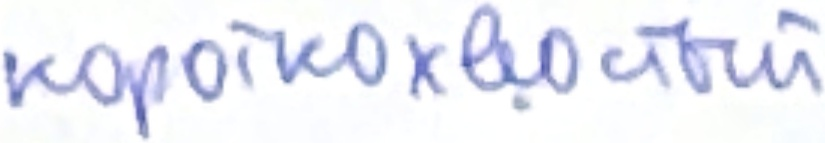короткохвостый
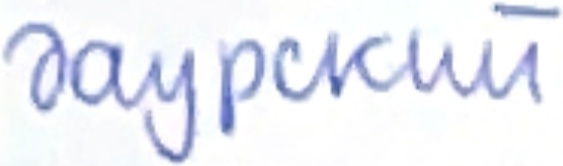даурский
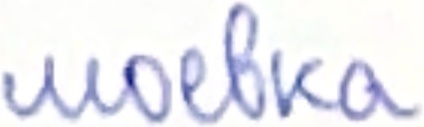моевка
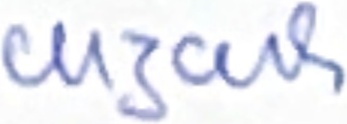сизая
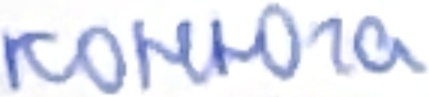конюга
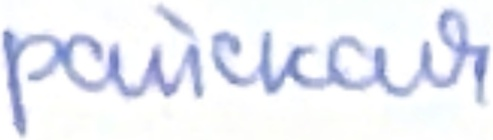райская
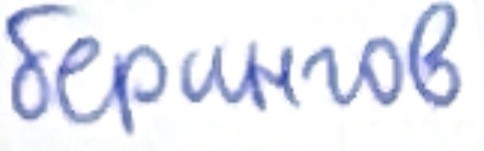берингов
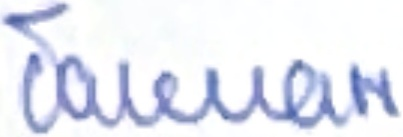баклан
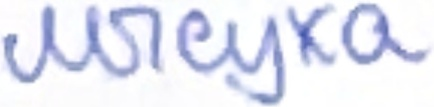лысуха
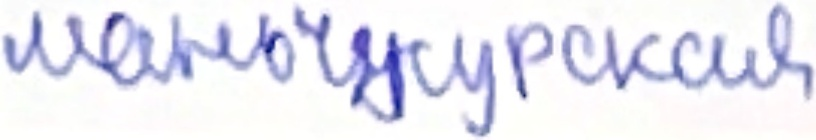маньчжурская
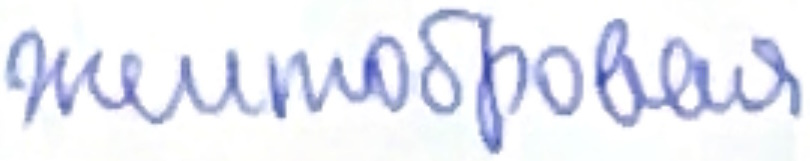желтобровая
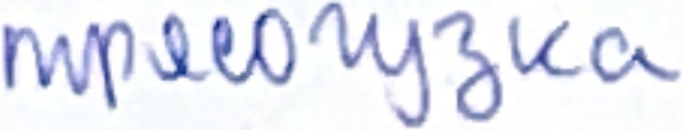трясогузка
